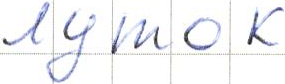луток
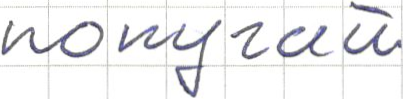попугай
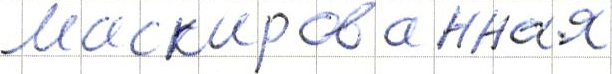маскированная
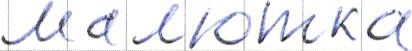малютка
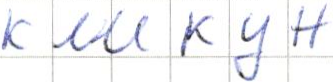кликун
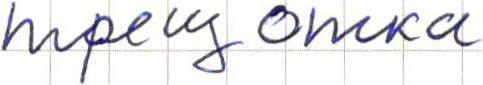трещотка
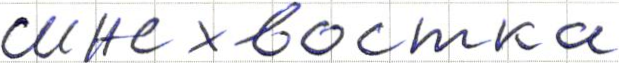синехвостка
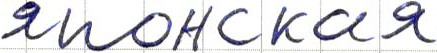японская
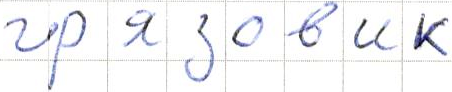грязовик
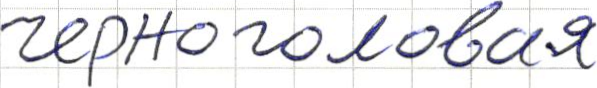черноголовая
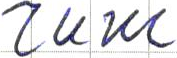чиж
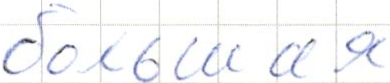большая
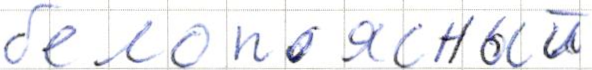белопоясный
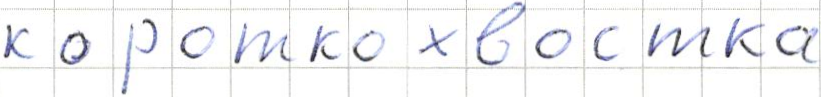ко ротко хвостка
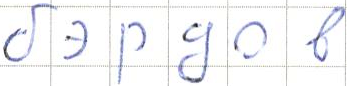бэрдов
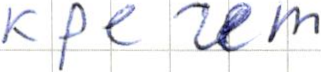кречет
